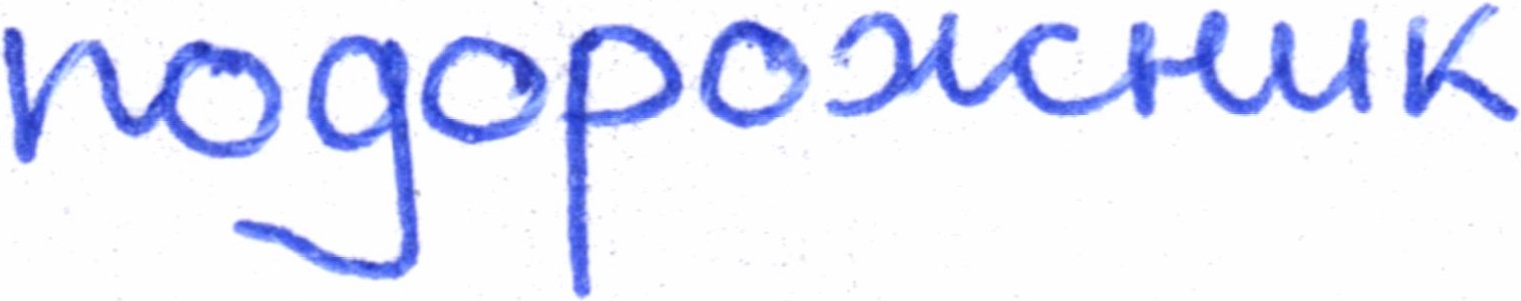подорожник
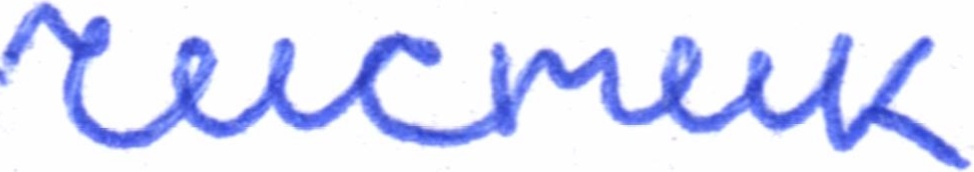чистик
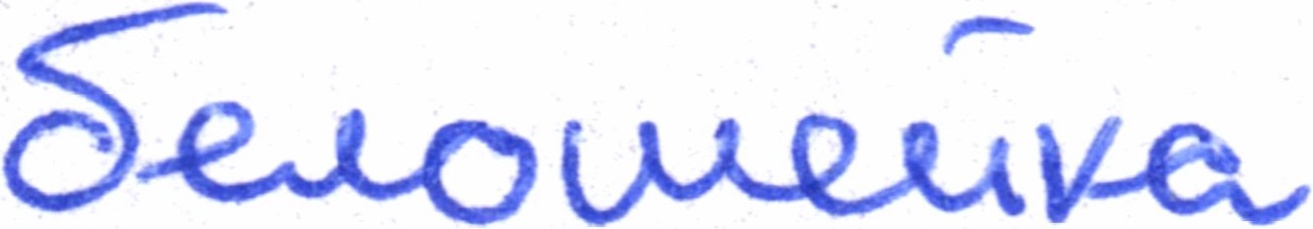белошейка
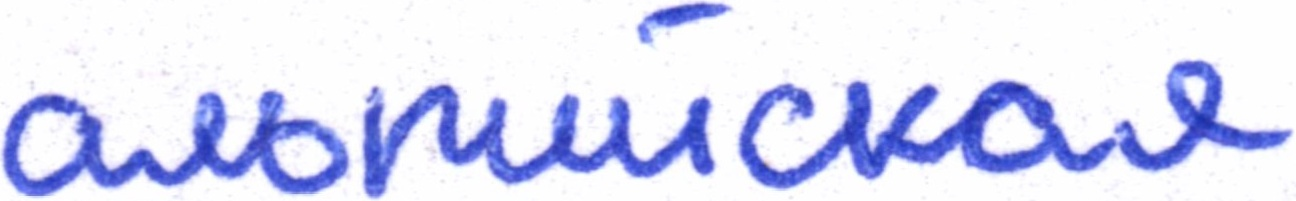альпийская
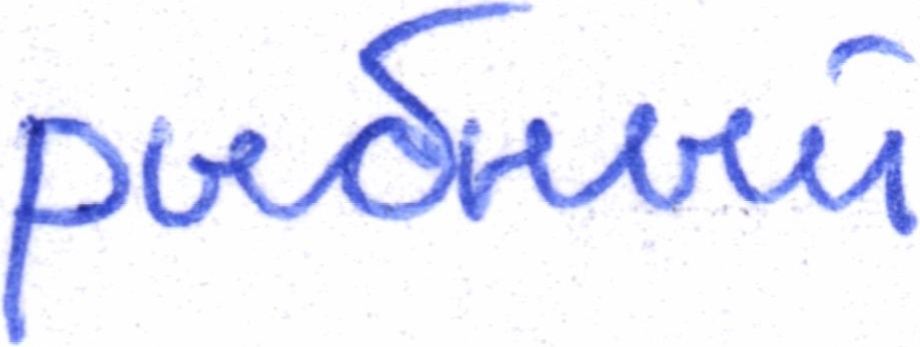рыбный
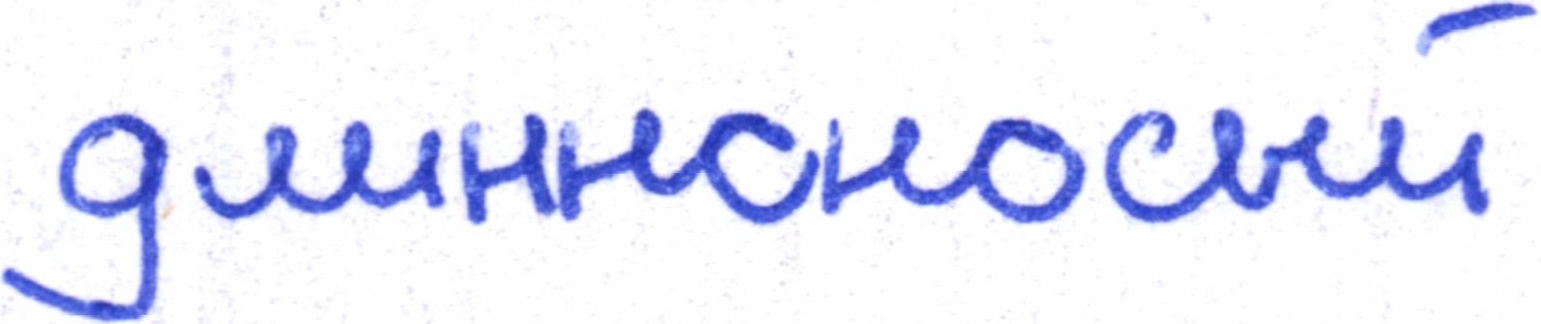длинноносый
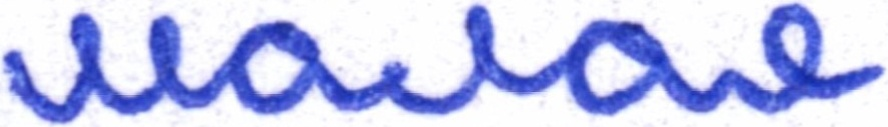малая
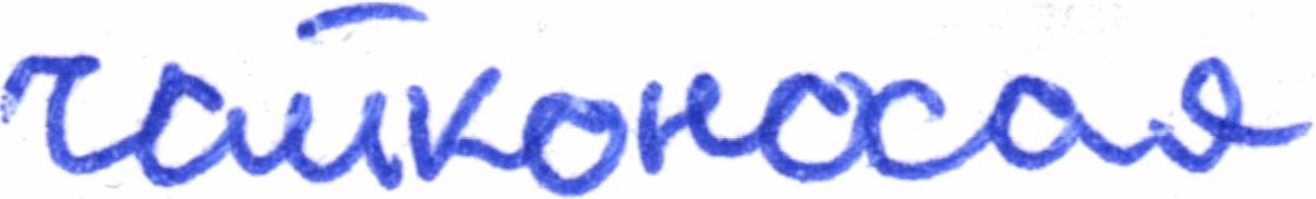чайконосая
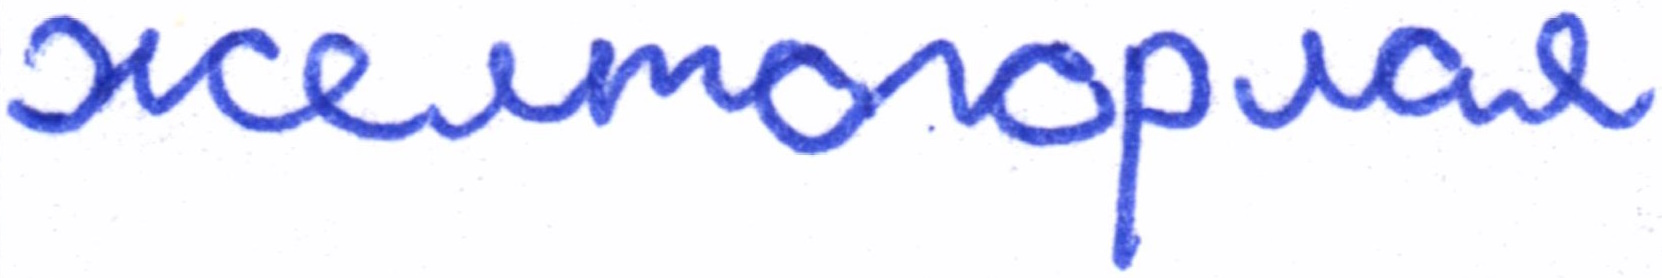желтогорлая
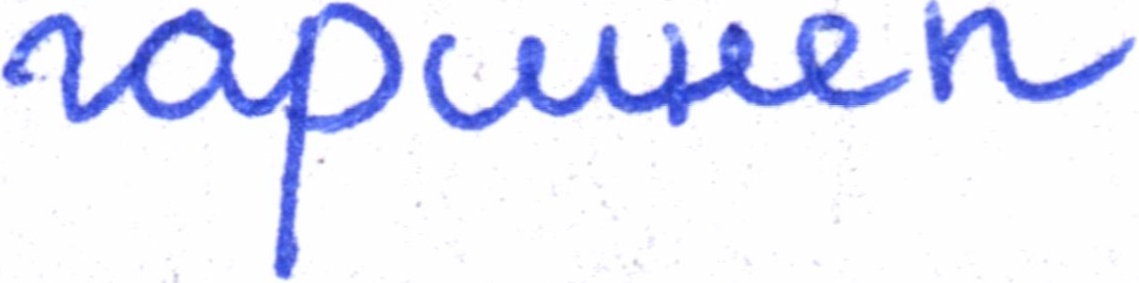гаршнеп
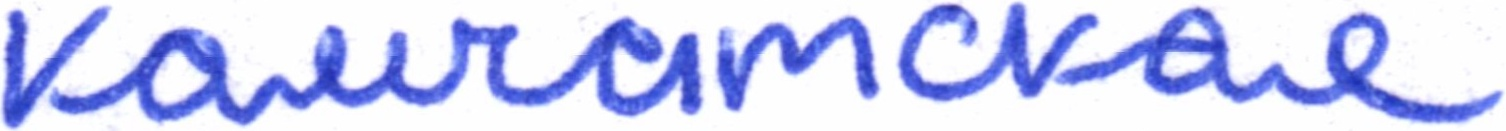камчатская
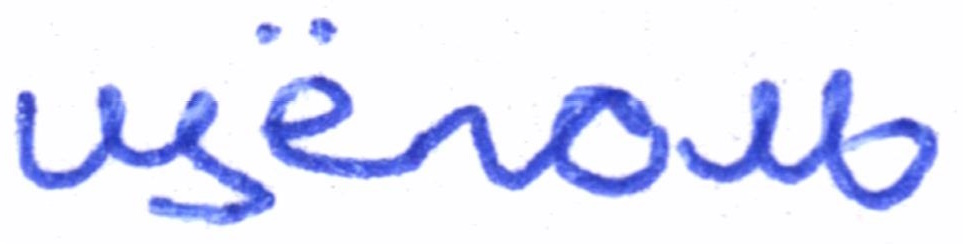щёголь
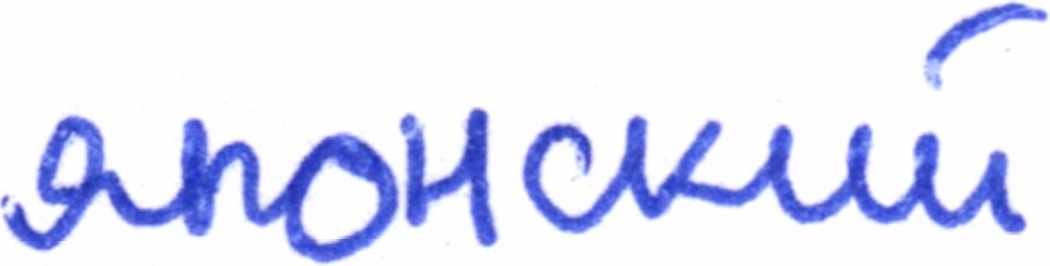японский
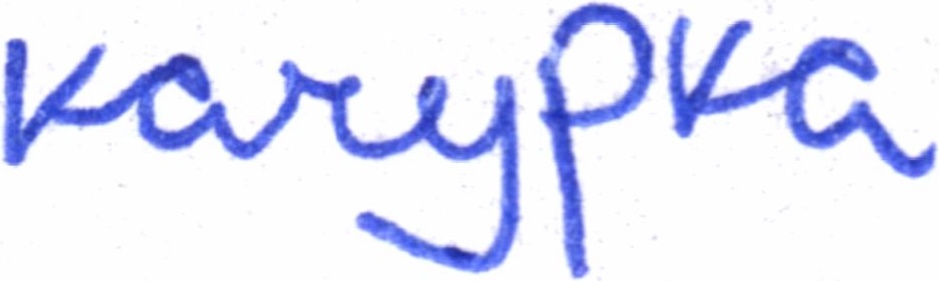качурка
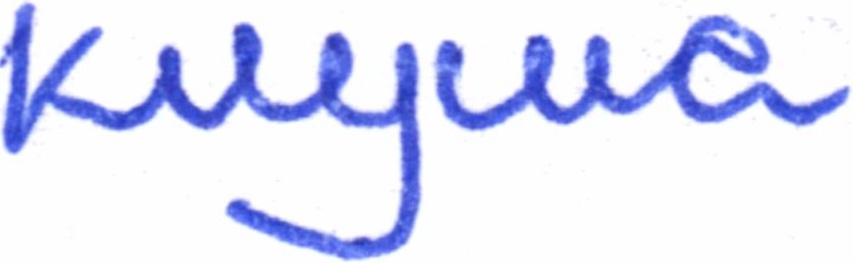клуша
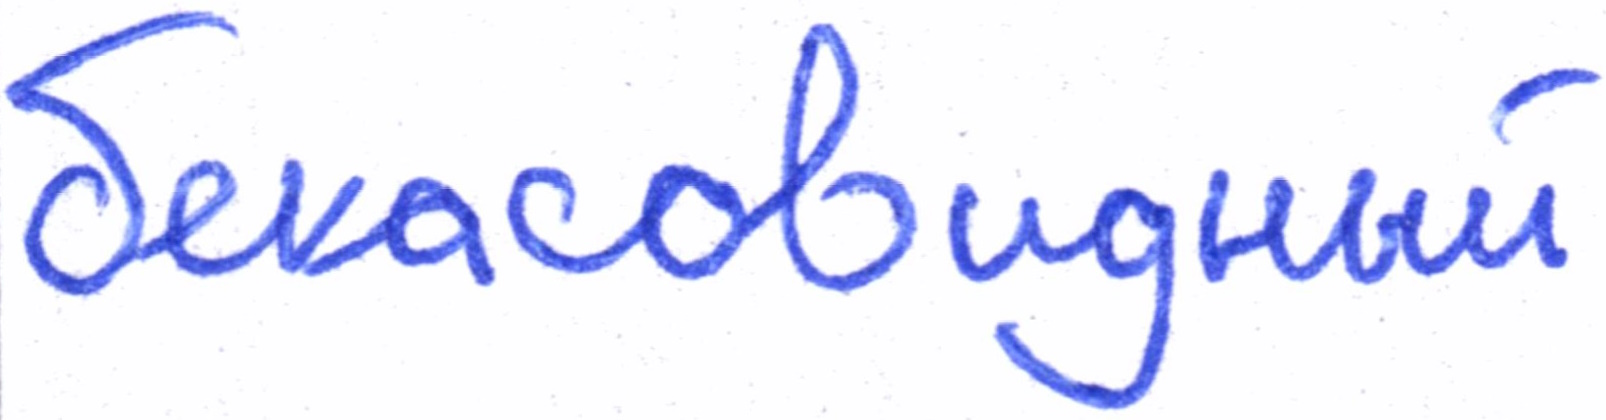бекасовидный
